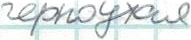черноухая
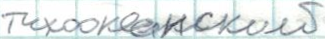тихоокеанский
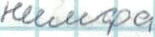нимфа
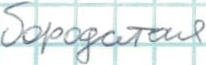бородатая
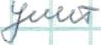улит
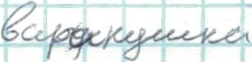варакушка
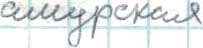амурская
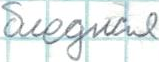бледная
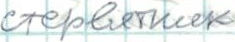стервятник
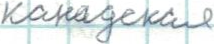канадская
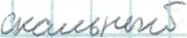скальный
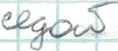седой
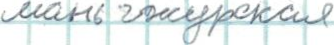маньчжурская
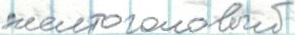желтоголовый
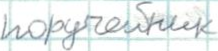поручейник
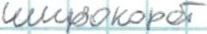широкорот
